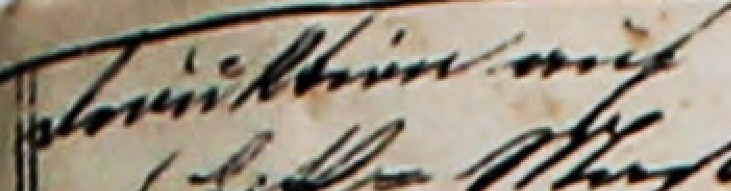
Funcktion auf
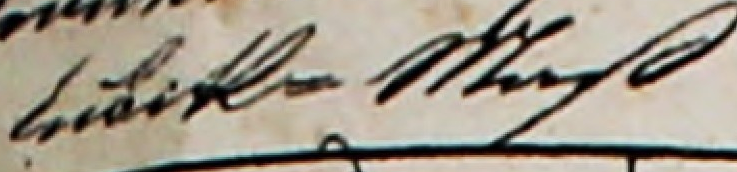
Cubika Maß
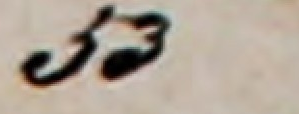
53
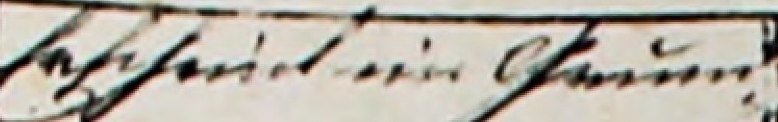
Ertsch??? im Grund„
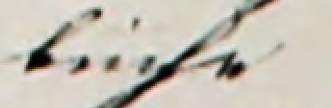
buche
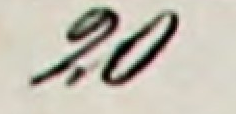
20
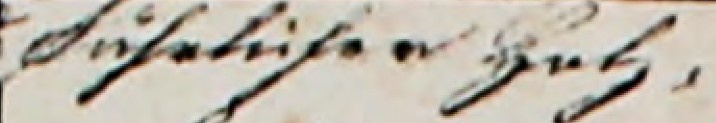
Fuhrleiter Holz„
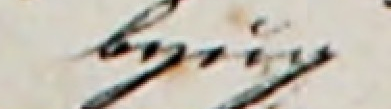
bezug
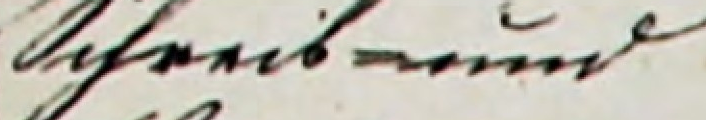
Schreib- und
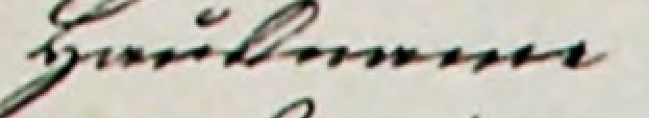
Hausname
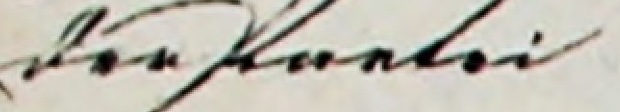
der Partei
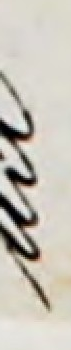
ad
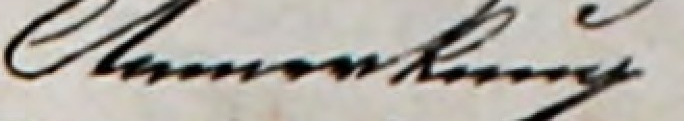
Anmerkung
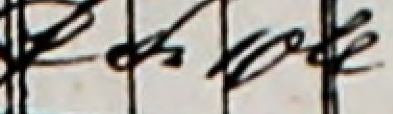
P Fr 10ll
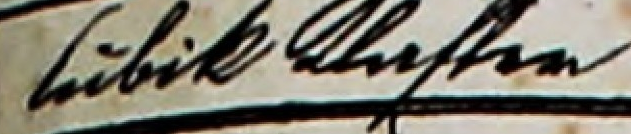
Cubik Klaster
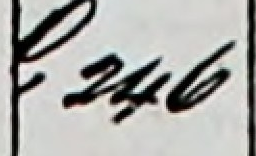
0,246
